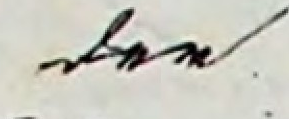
der
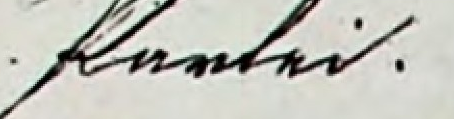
Partei.
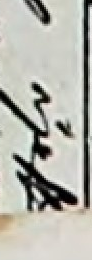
H???
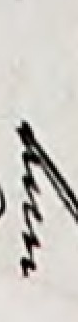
ung
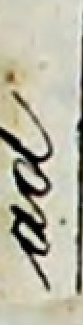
ad
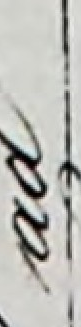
ad
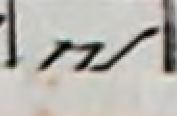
K.
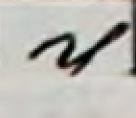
J.
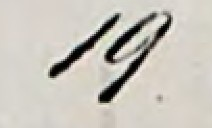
19
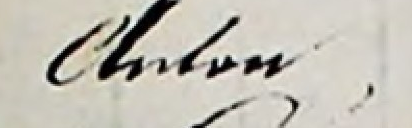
Anton
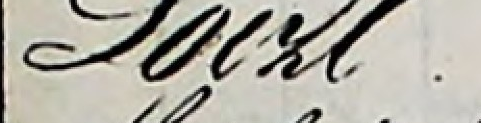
Loizl
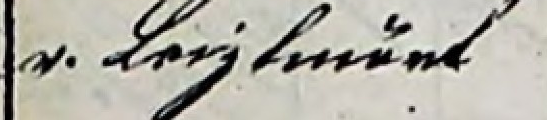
v. Loizlmört
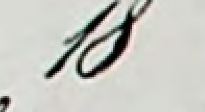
18
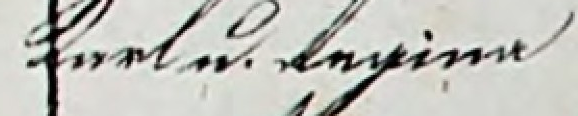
Karl u. Regina
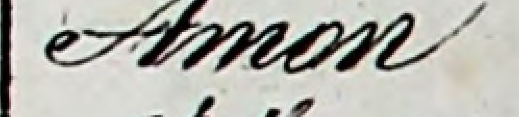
Amon
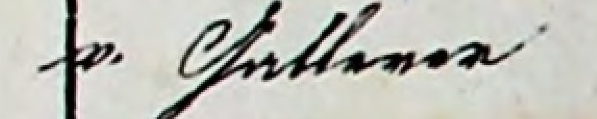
v. Gatterer
